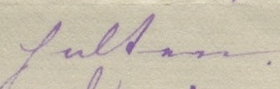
halten.
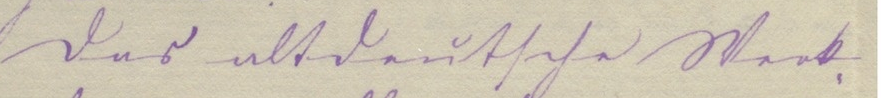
Das altdeutsche Werk-
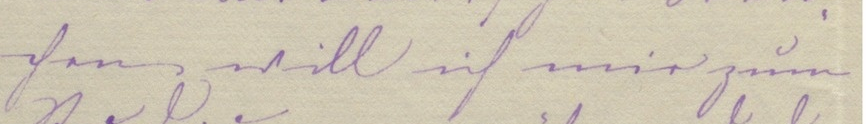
chen will ich mir zum
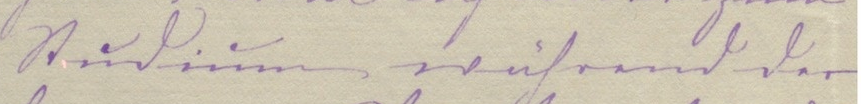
Studium während der
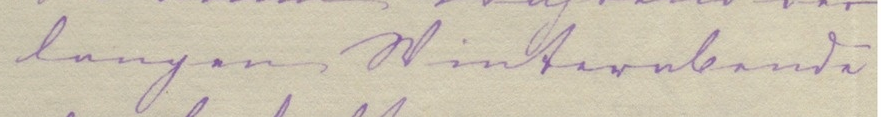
langen Winterabende
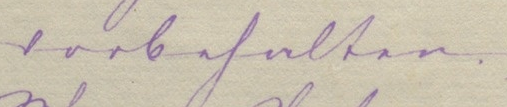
vorbehalten.
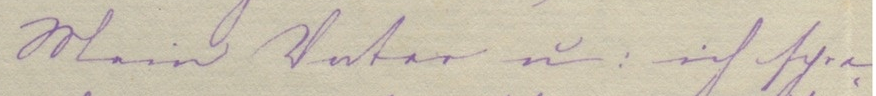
Mein Vater u: ich spre-
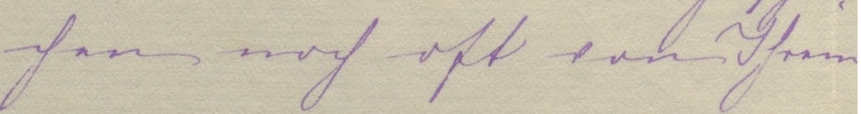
chen noch oft von Ihrem
